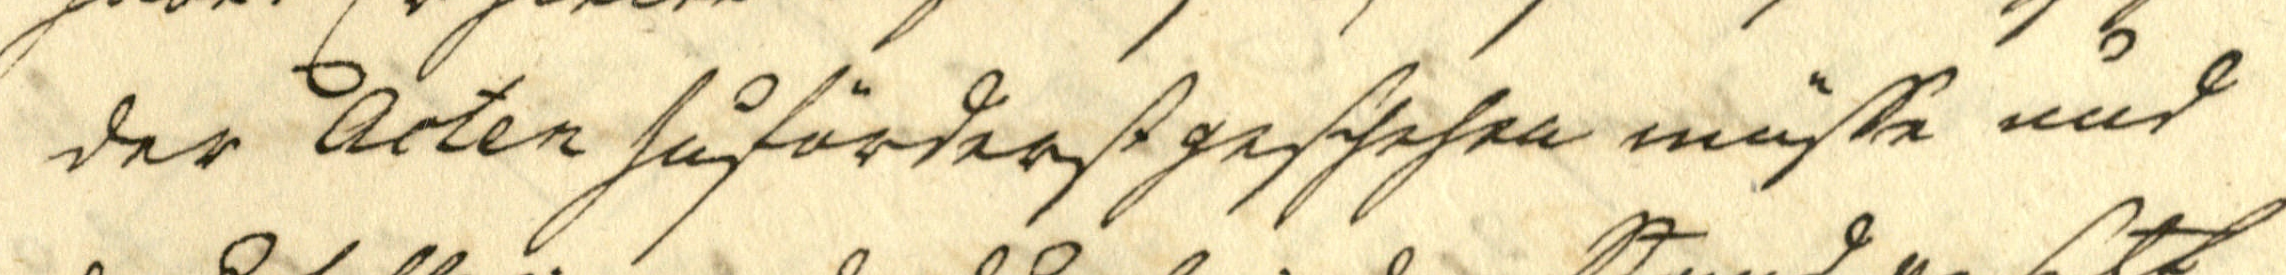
der Acten zuförderst geschehen müsse und
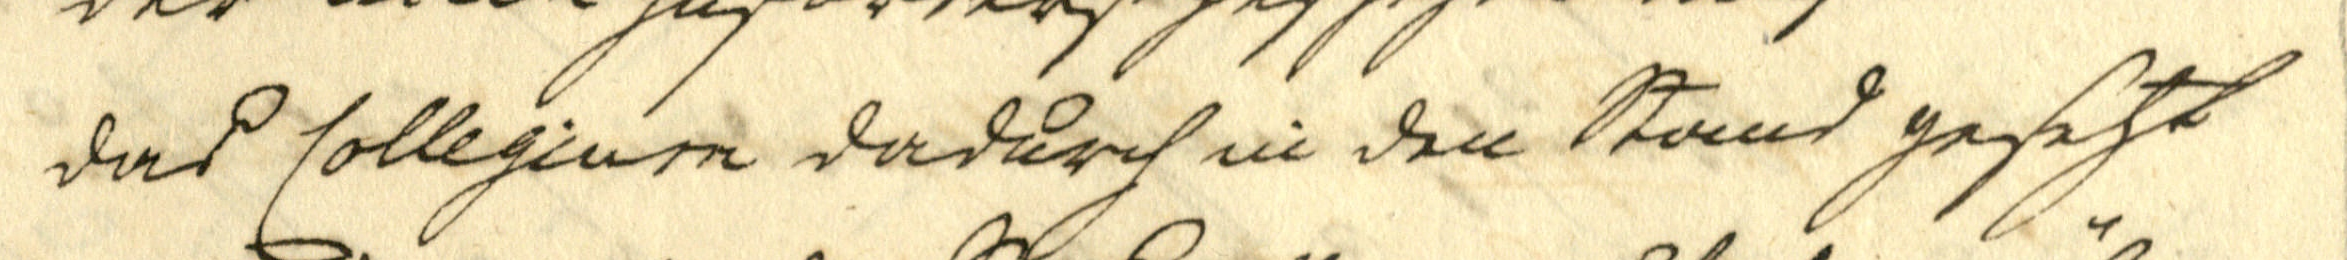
das Collegium dadurch in den Stand gesetzt
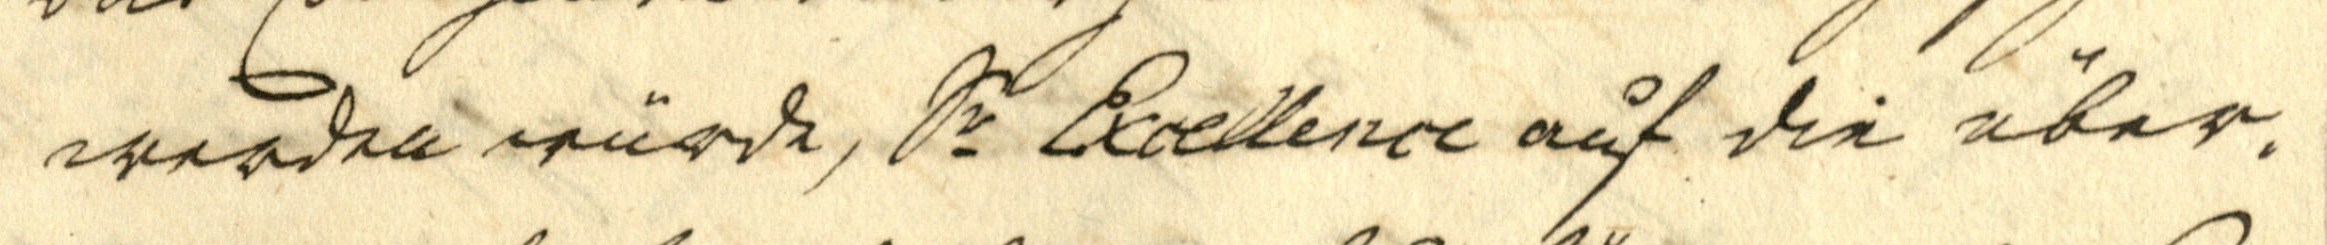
werden würde, Sr Excellence auf die über¬
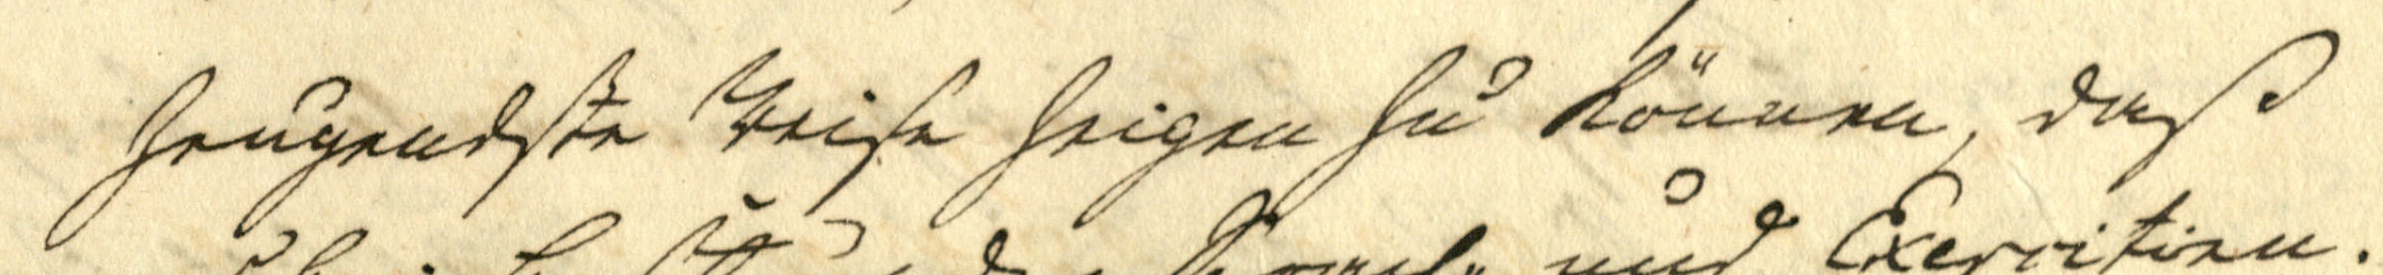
zeugendste Weise zeigen zu können, daß
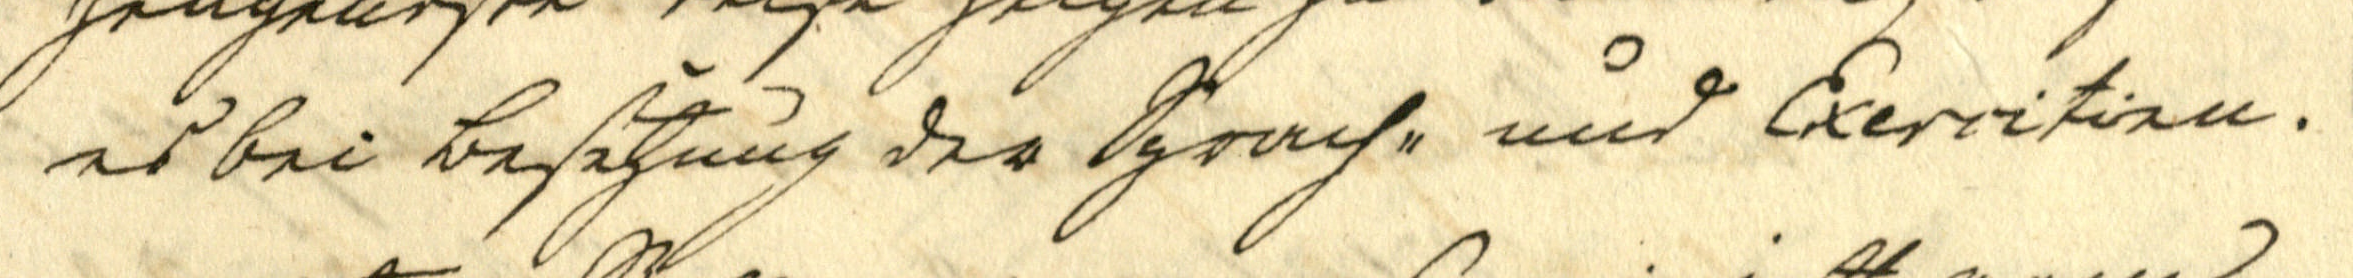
es bei Besetzung der Sprach- und Exercitien¬
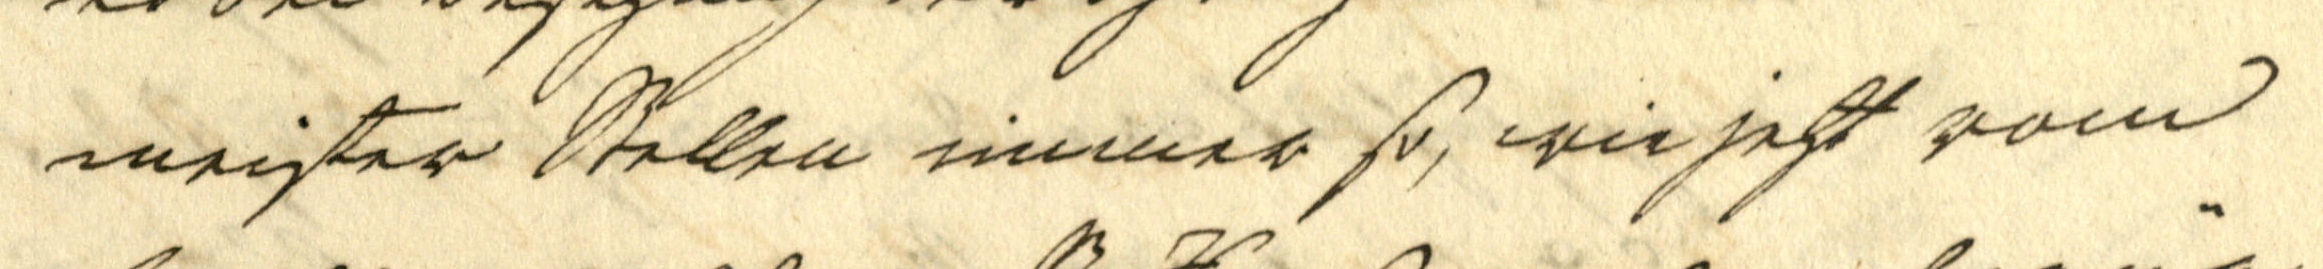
meister Stellen immer so, wie jetzt vom
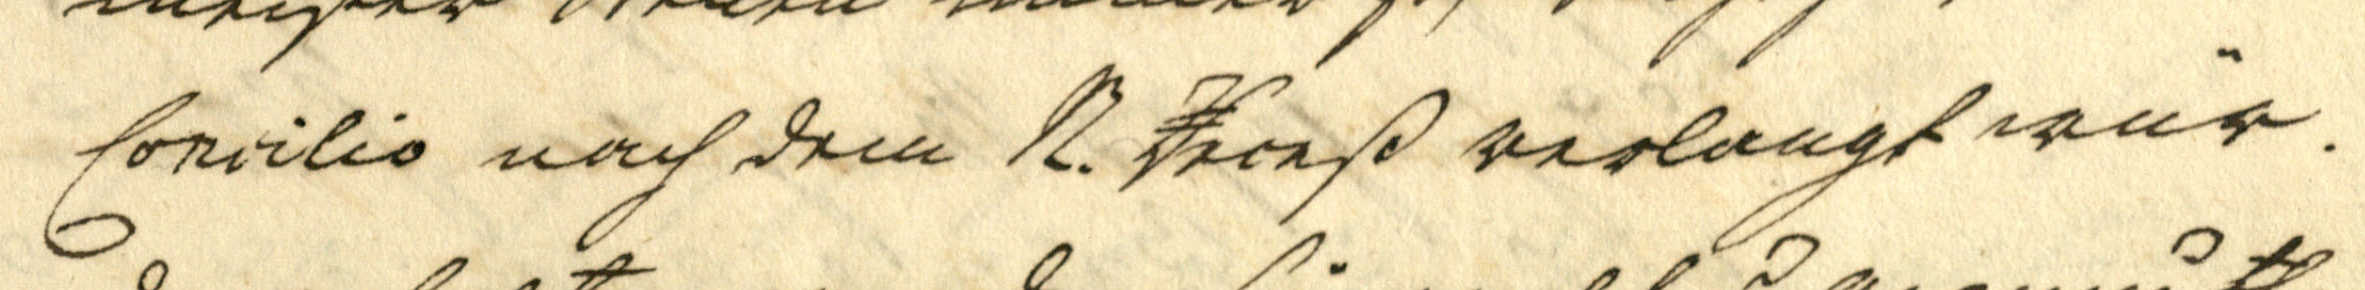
Concilio nach dem N. Receß verlangt wür¬
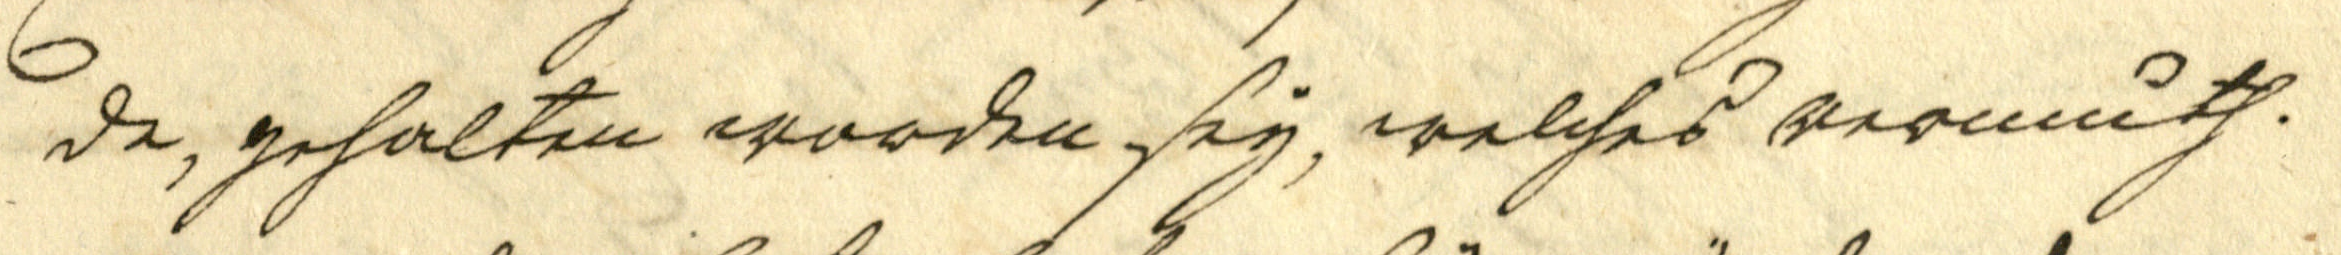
de, gehalten worden seÿ, welches vermuth¬
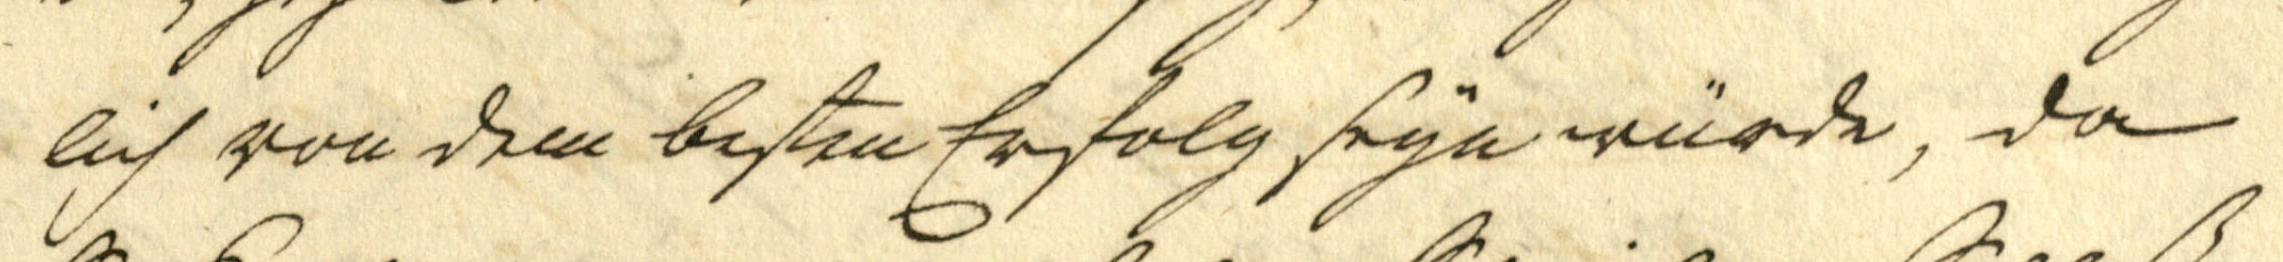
lich von dem besten Erfolg seÿn würde, da
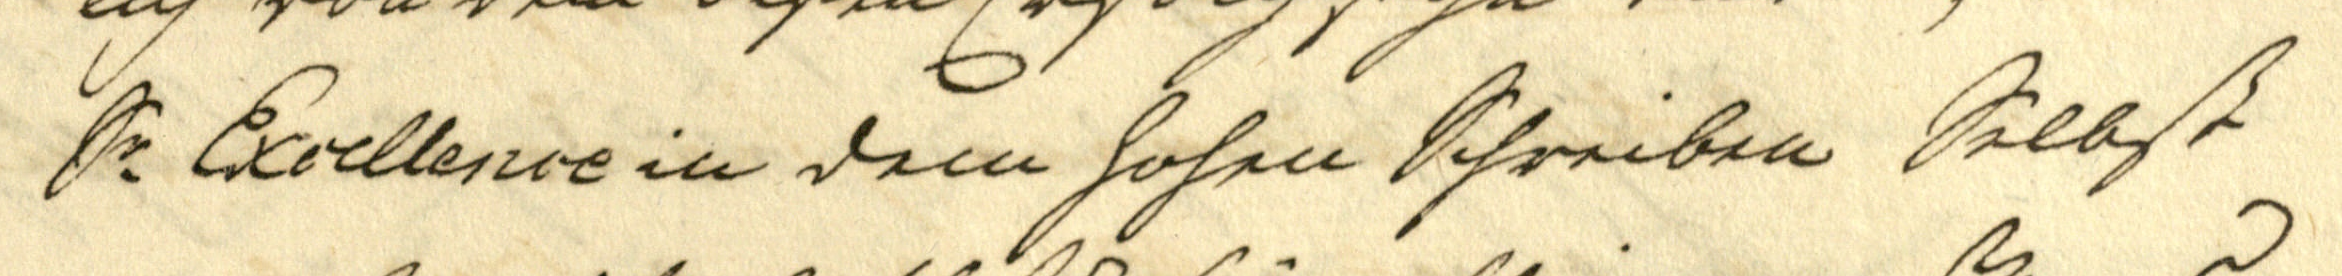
Sr. Excellence in dem hohen Schreiben Selbst
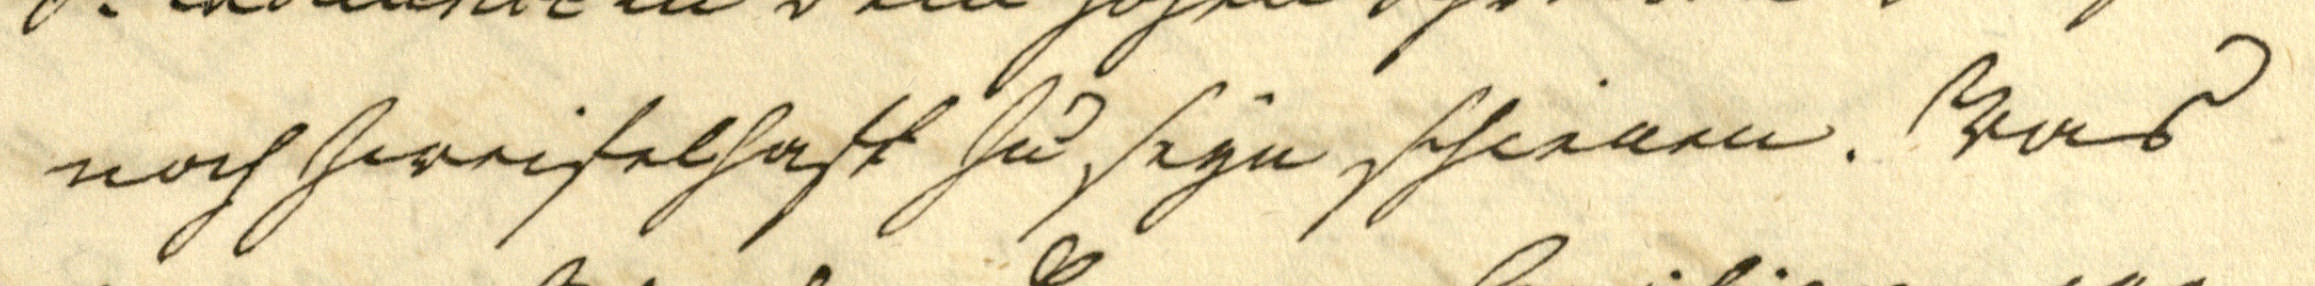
noch zweifelhaft zu seÿn schienen. Was
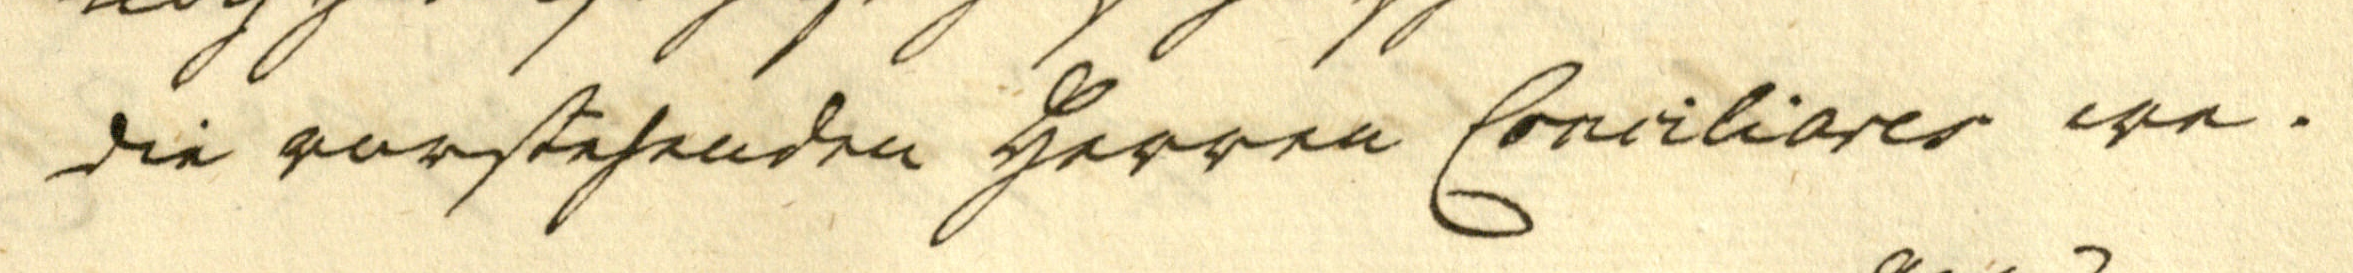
die vorstehenden Herren Conciliares we¬
